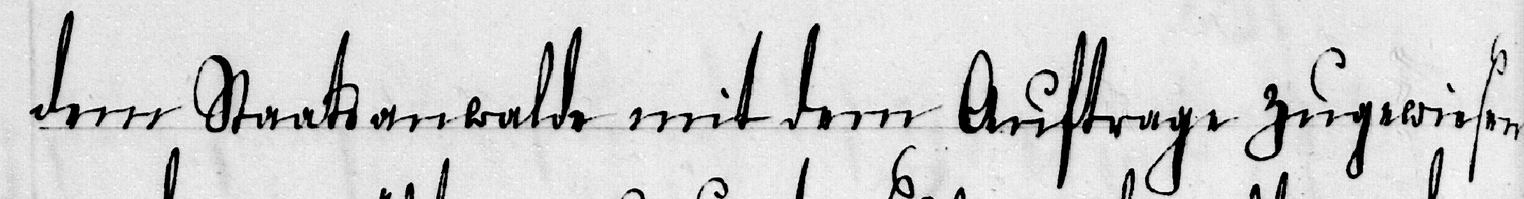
dem Staatsanwalde mit dem Auftrage zugewiesen
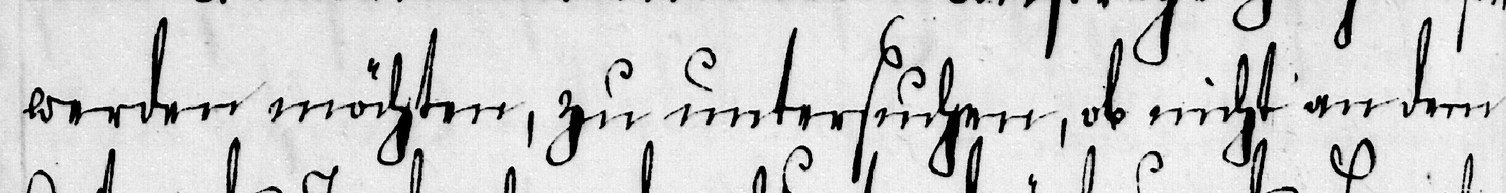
werden möchten, zu untersuchen, ob nicht an dem
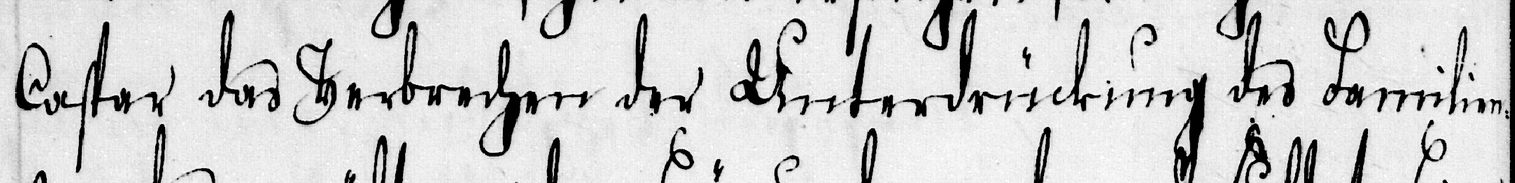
Caspar das Verbrechen der Unterdrückung des Familien¬
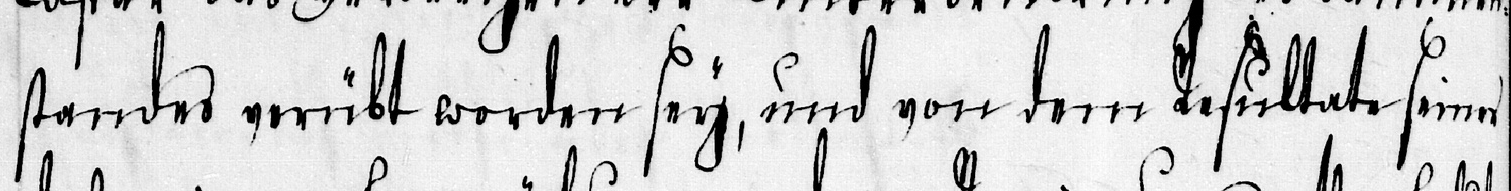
standes verübt worden sey, und von dem Resultate sei¬
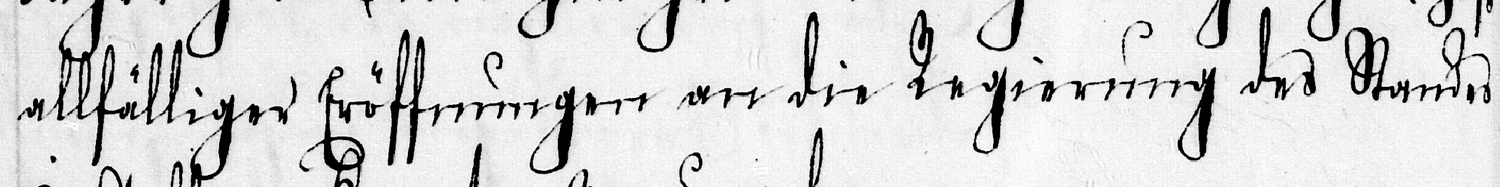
allfälliger Eröffnungen an die Regierung des Standes
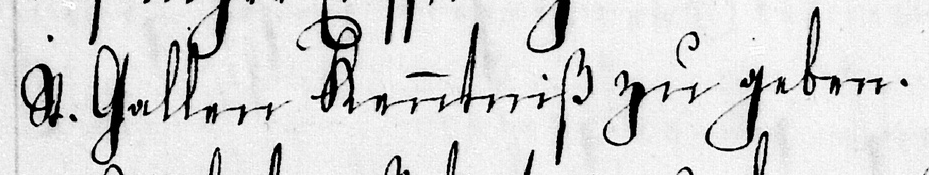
St. Gallen Kenntniß zu geben.
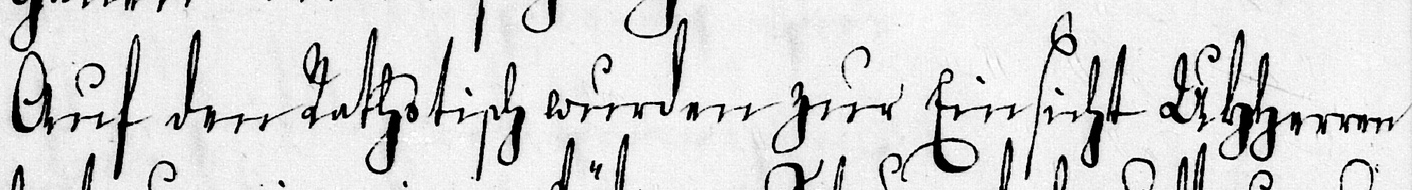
Auf den Rathstisch wurden zur Einsicht UHHerren
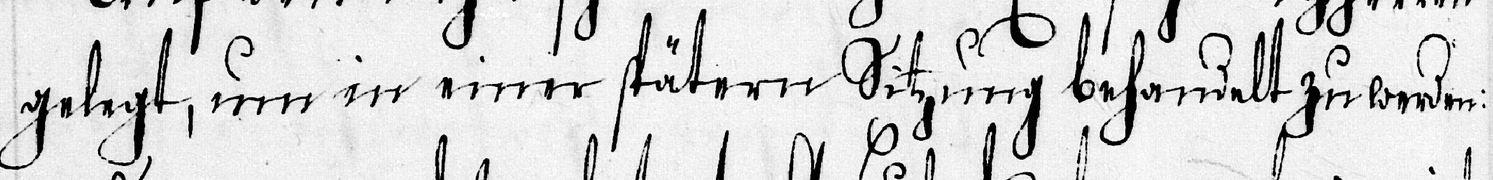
gelegt, um in einer spätern Sitzung behandelt zu werde¬
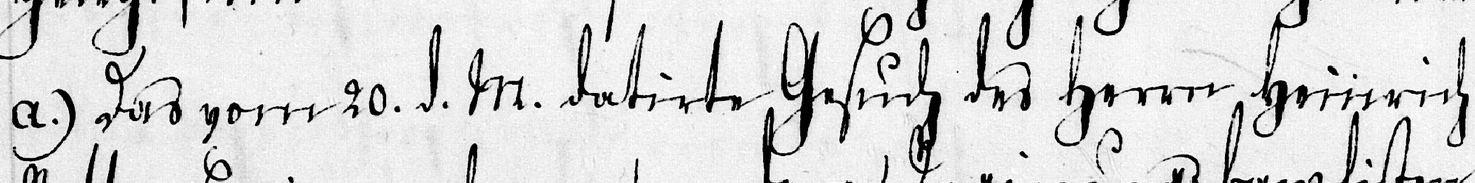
a.) Das vom 20. d. M. datirte Gesuch des Herrn Heinrich
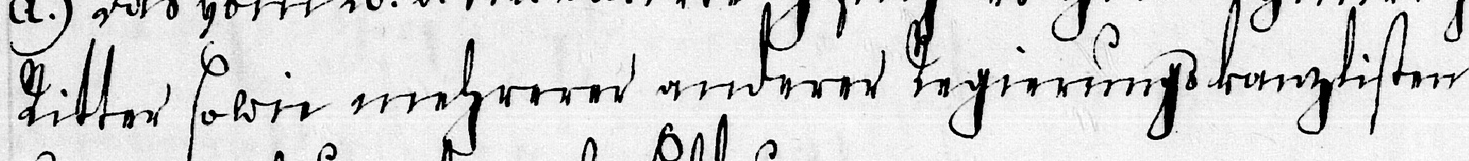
Ritter sowie mehrerer anderer Regierungskanzlisten
